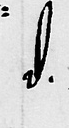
d.
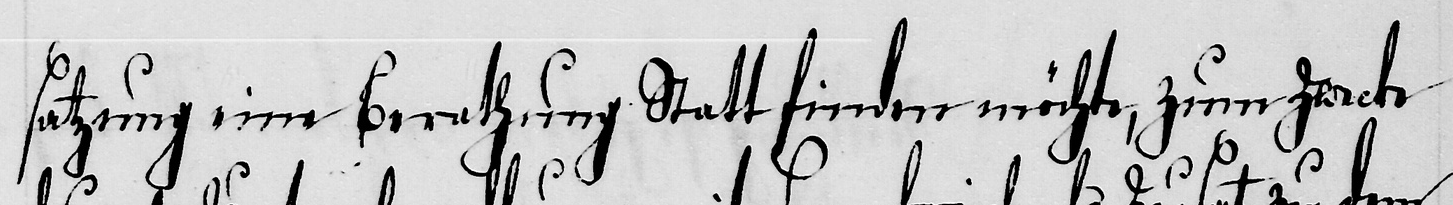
satzung eine Berathung Statt finden möchte, zum Zwecke
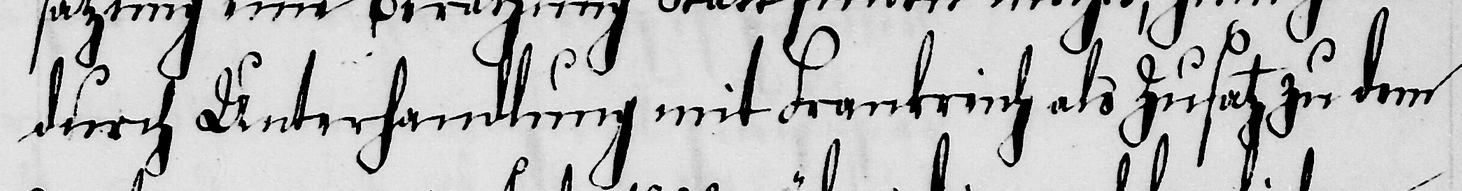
durch Unterhandlung mit Frankreich als Zusatz zu dem
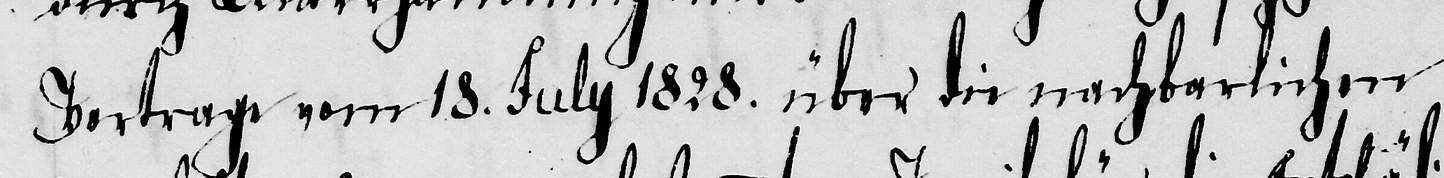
Vertrage vom 18. July 1828. über die nachbarlichen
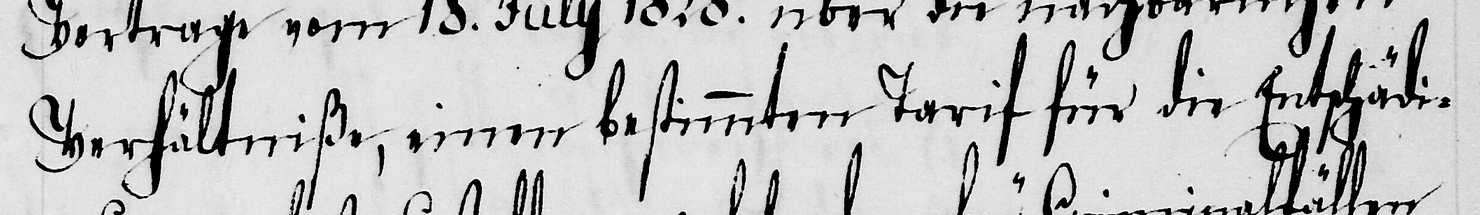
Verhältniße, einen bestimmten Tarif für die Entschädi¬
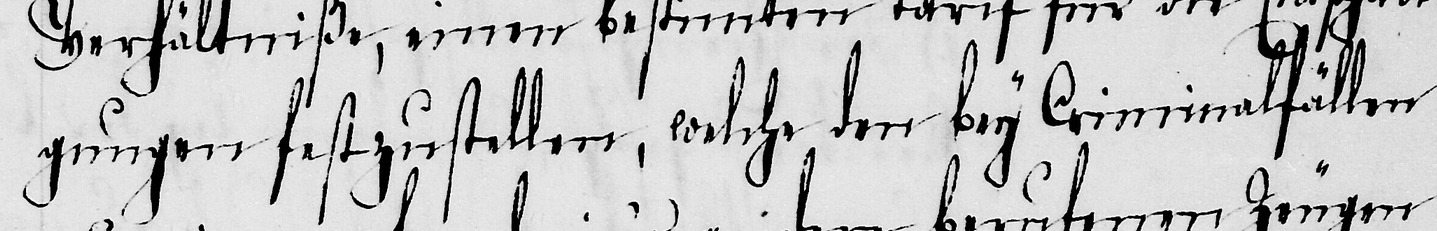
gungen festzustellen, welche den bey Criminalfällen
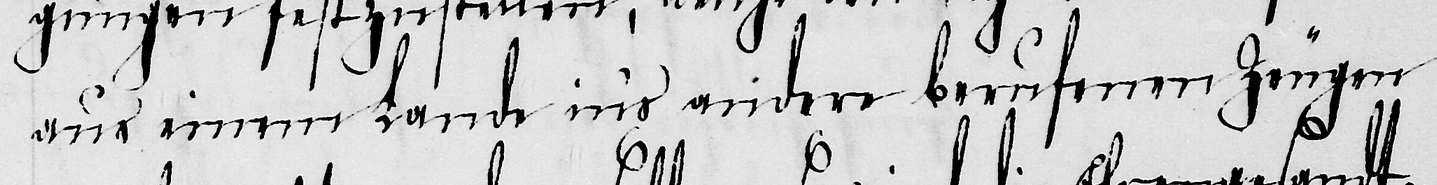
aus einem Lande ins andere berufenen Zeugen
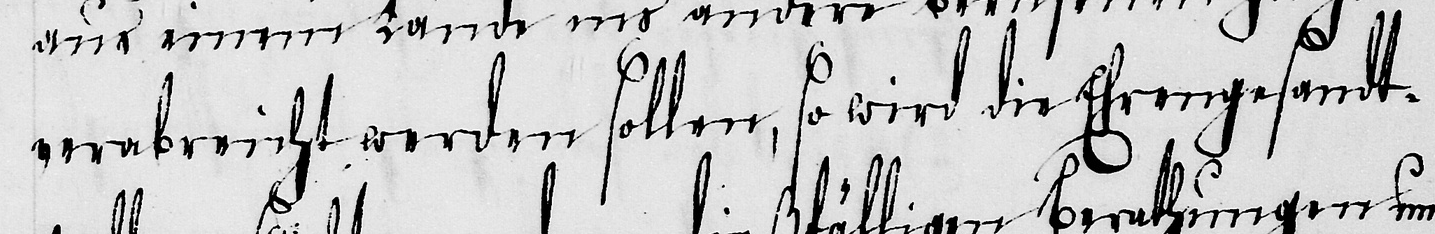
verabreicht werden sollen, so wird die Ehrengesandt¬
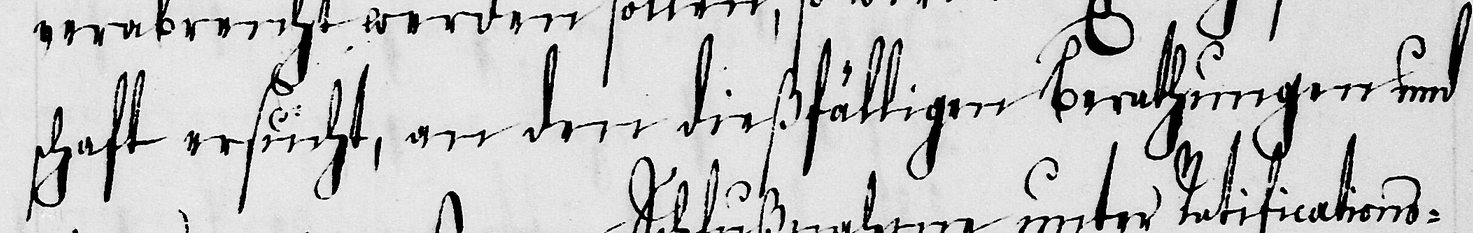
schaft ersucht, an den dießfälligen Berathungen und
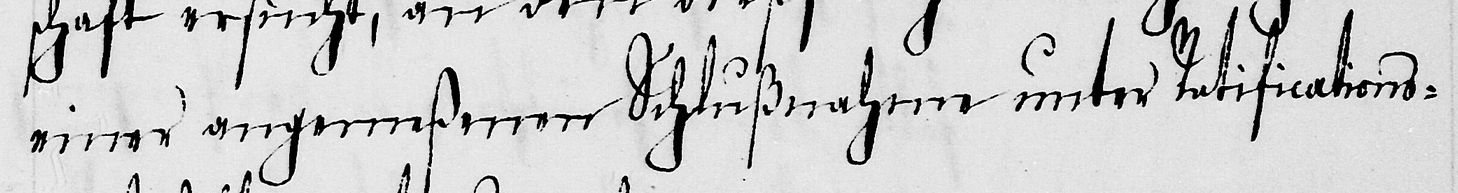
einer angemeßenen Schlußnahme unter Ratifications¬
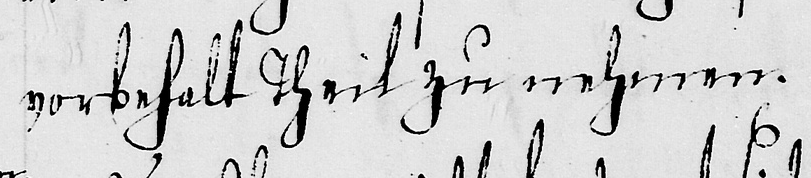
vorbehalt Theil zu nehmen.
